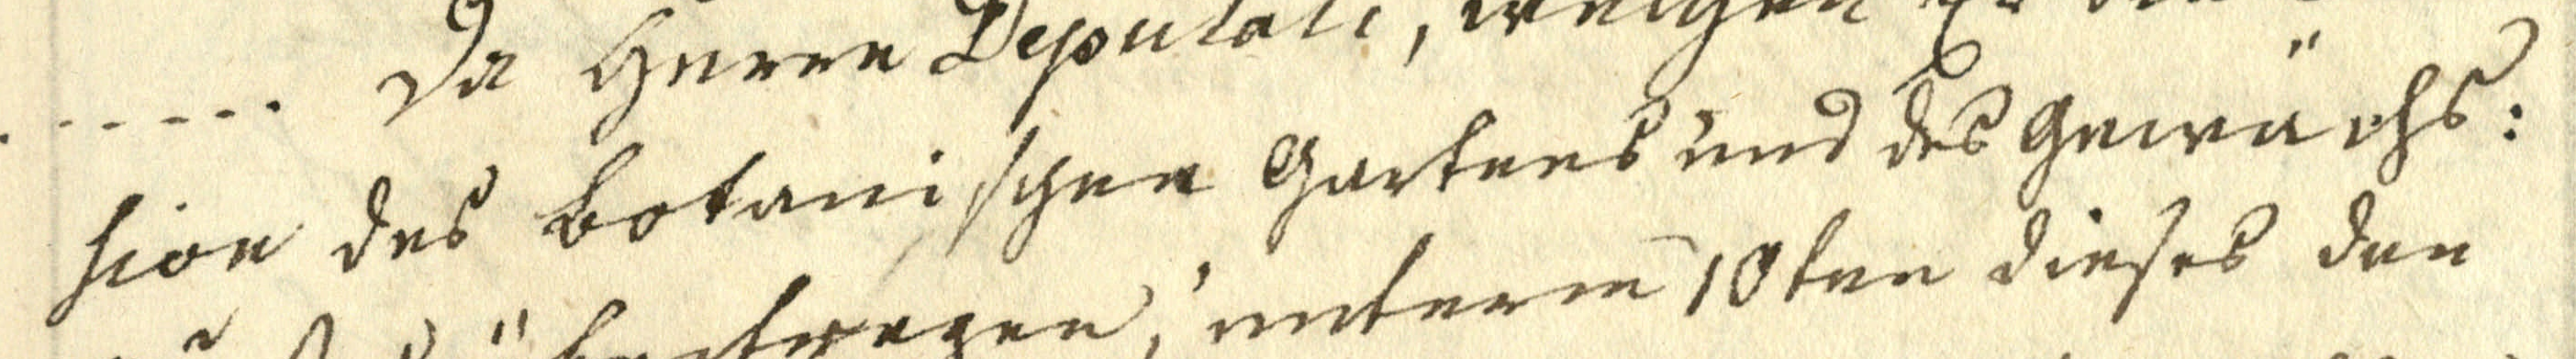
sion des botanischen Gartens und des Gewächs¬
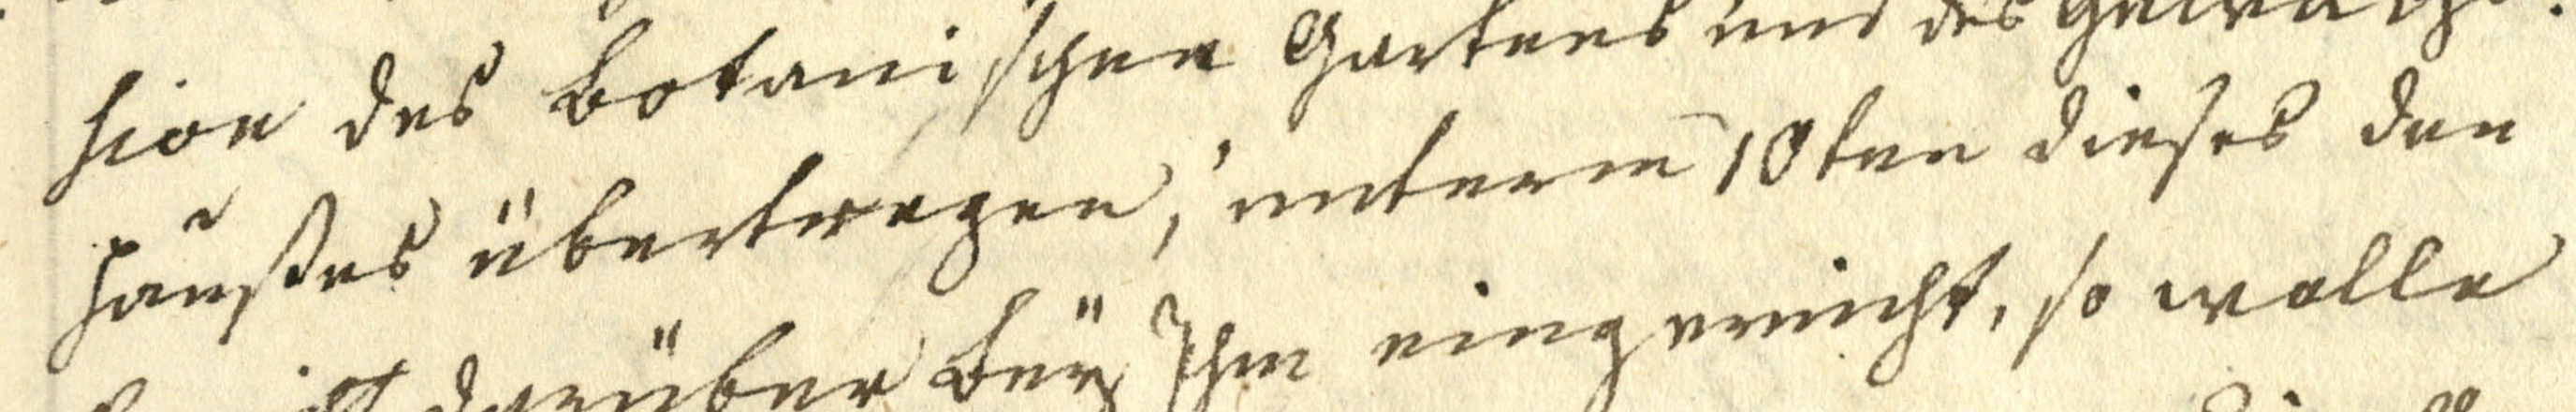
haußes übertragen, unterm 10ten dieses den
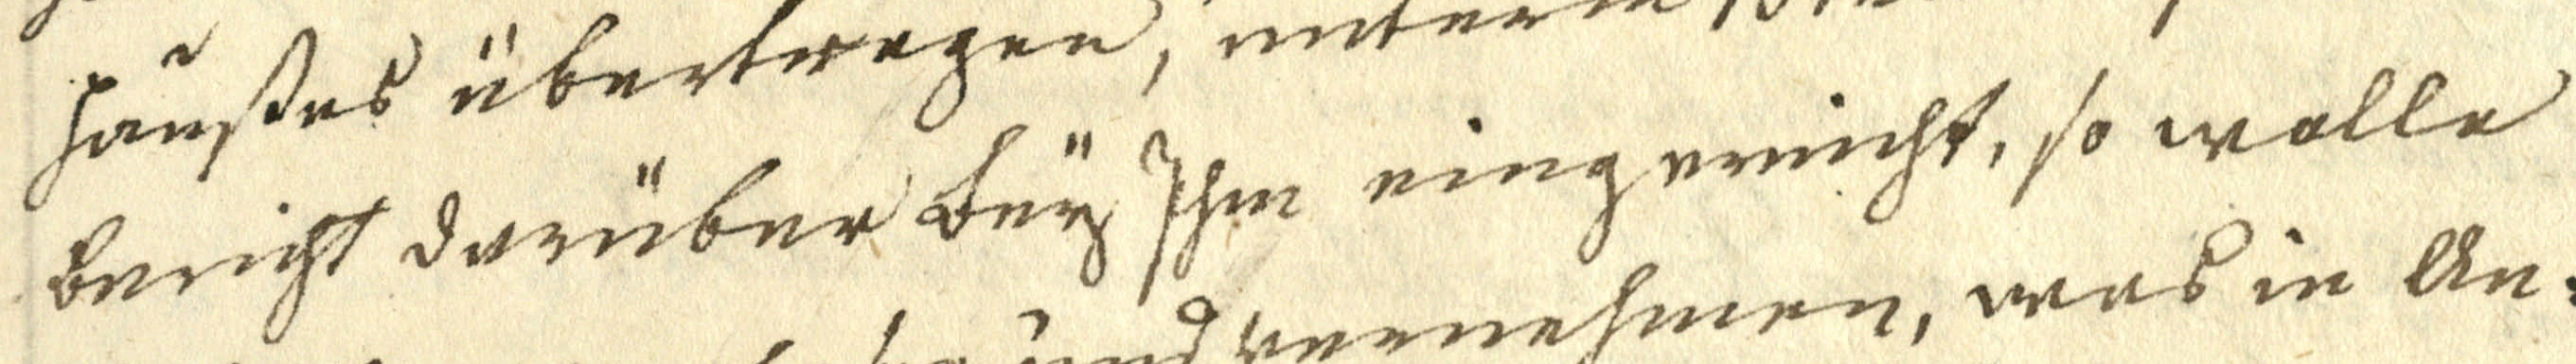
Bericht darüber beÿ Ihm eingereicht, so wolle
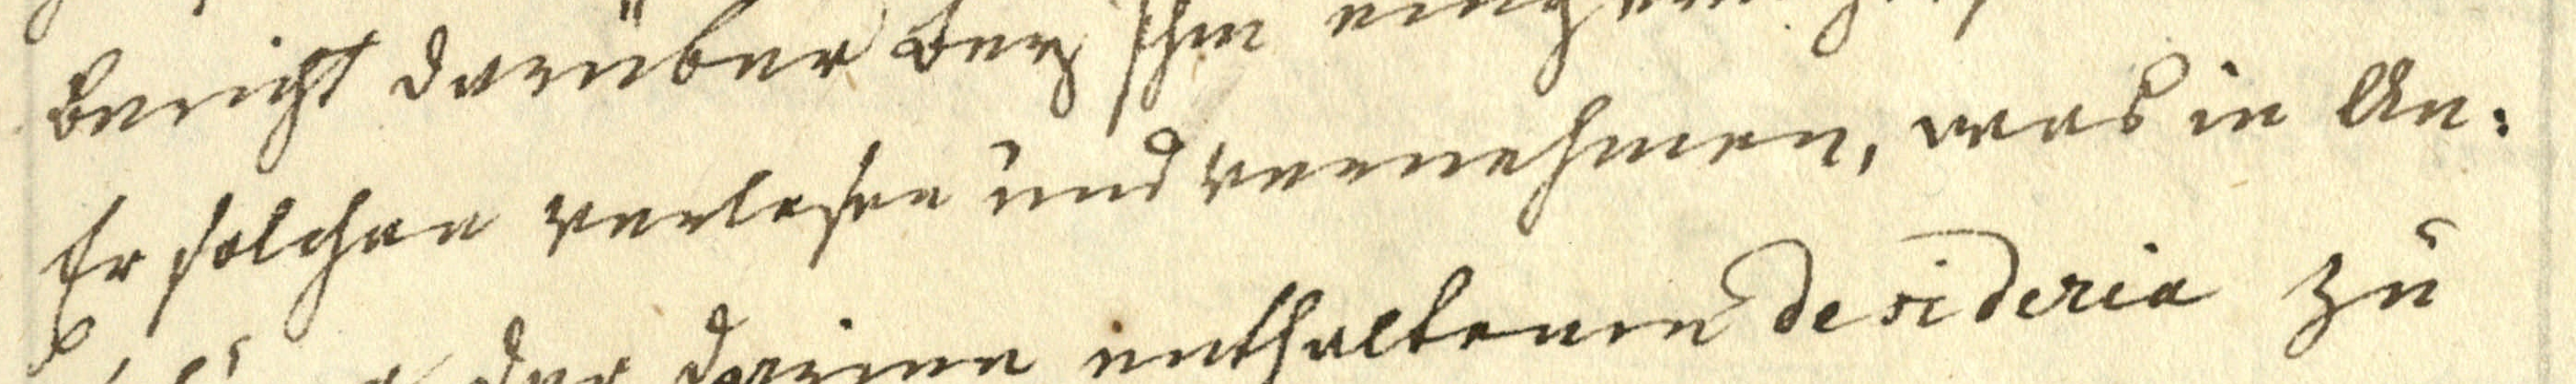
Er solchen verlesen und vernehmen, was in An¬
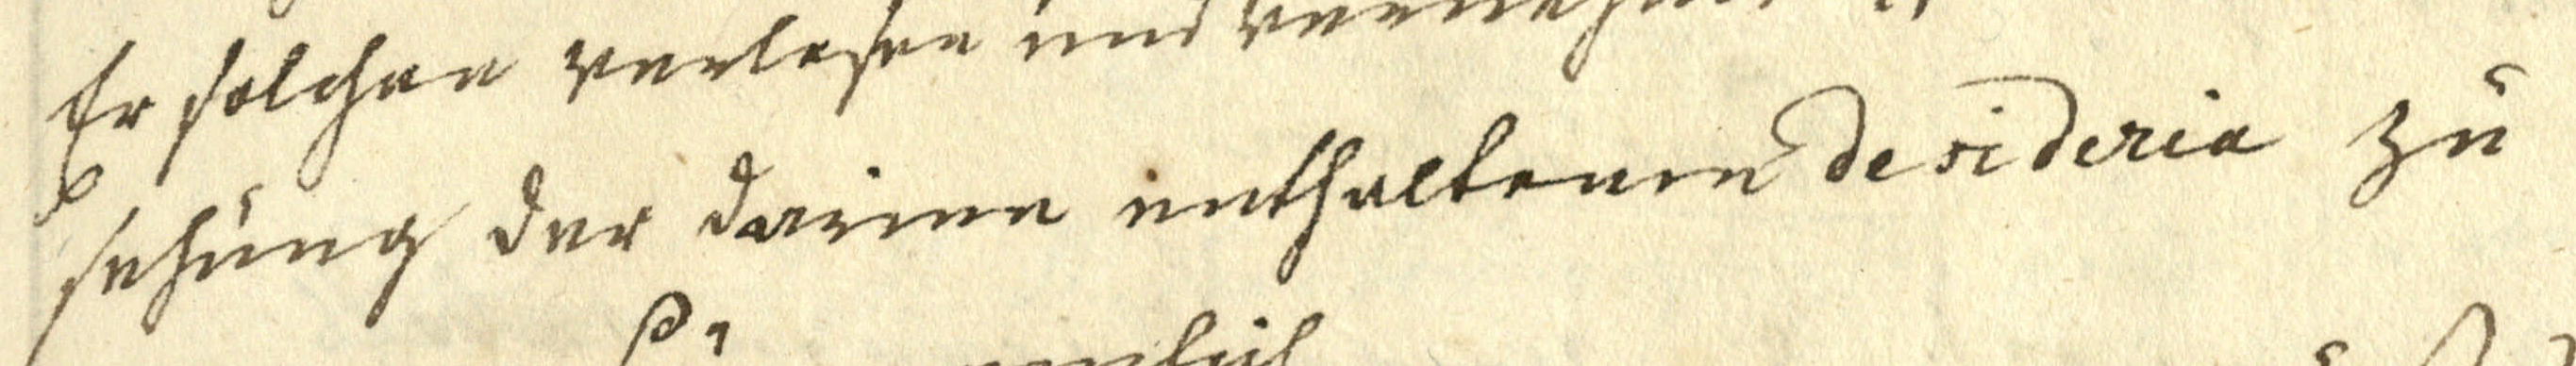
sehung der darinn enthaltenen desideria zu
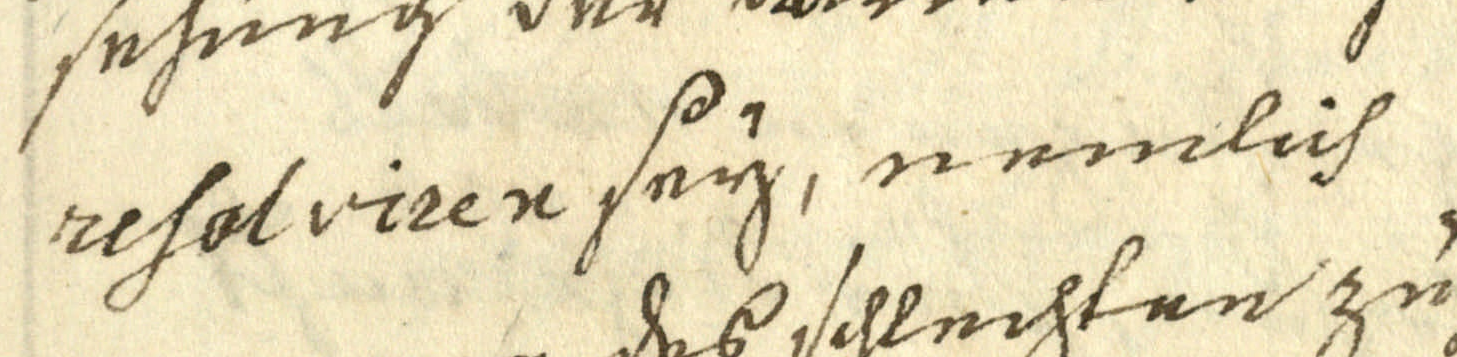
resolviren seÿ, nemlich
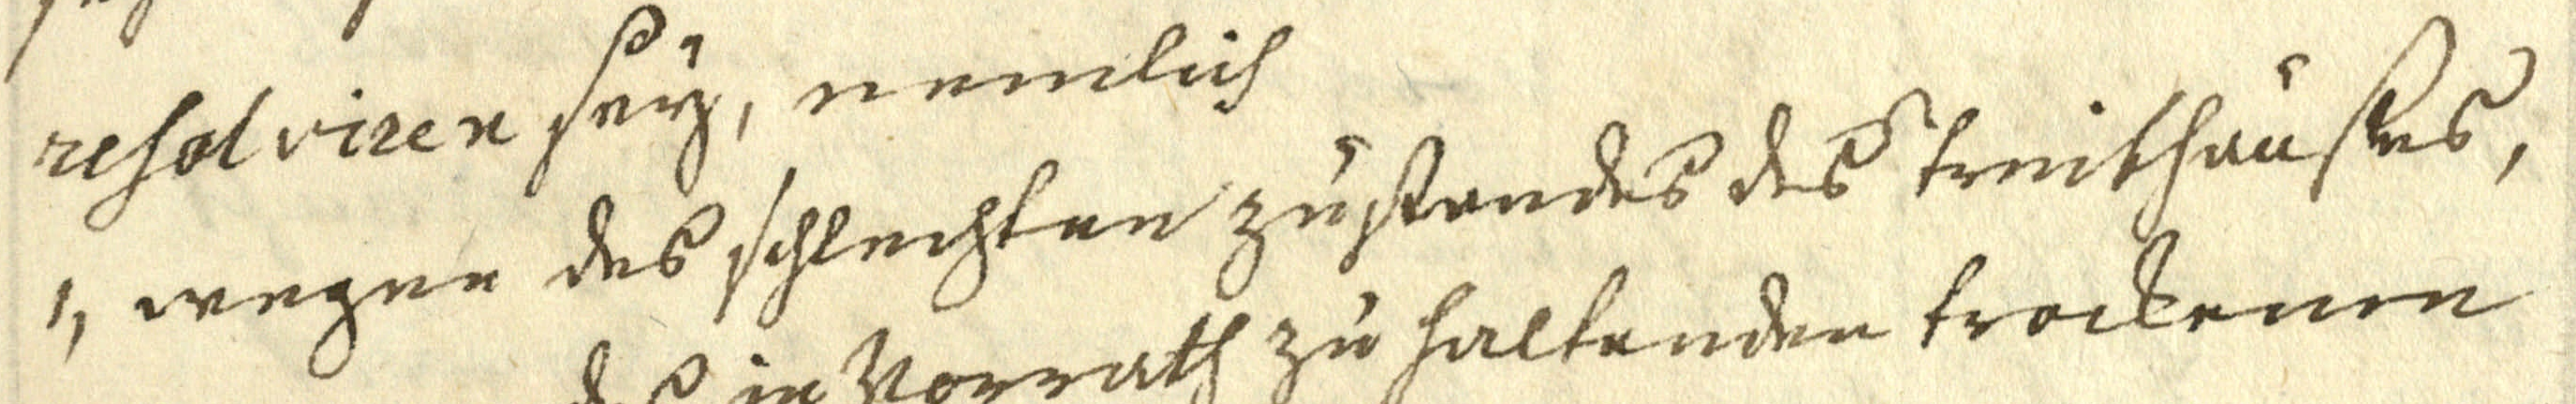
1, wegen des schlechten zustandes des Treibhaußes
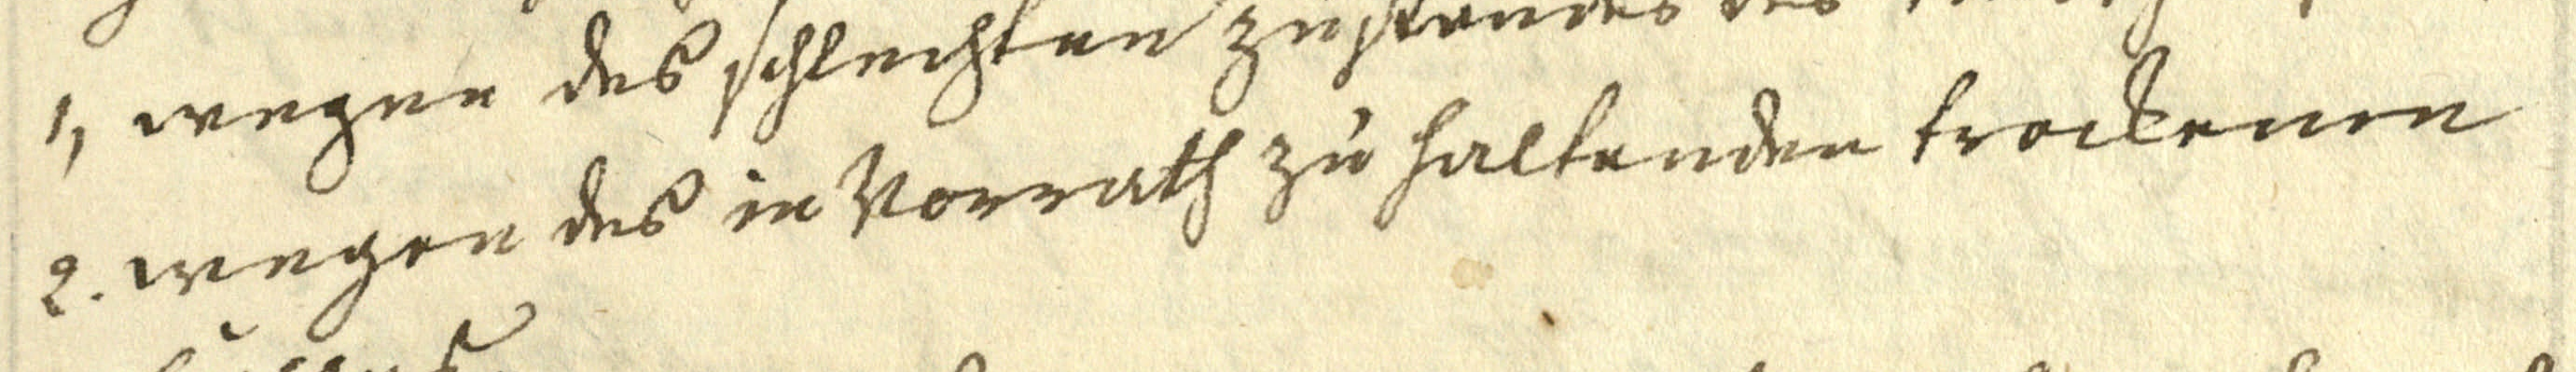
2. wegen des in Vorrath zu haltenden trockenen
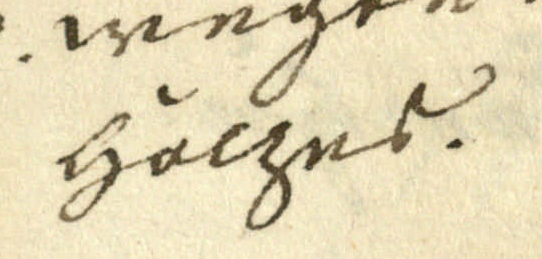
Holzes.
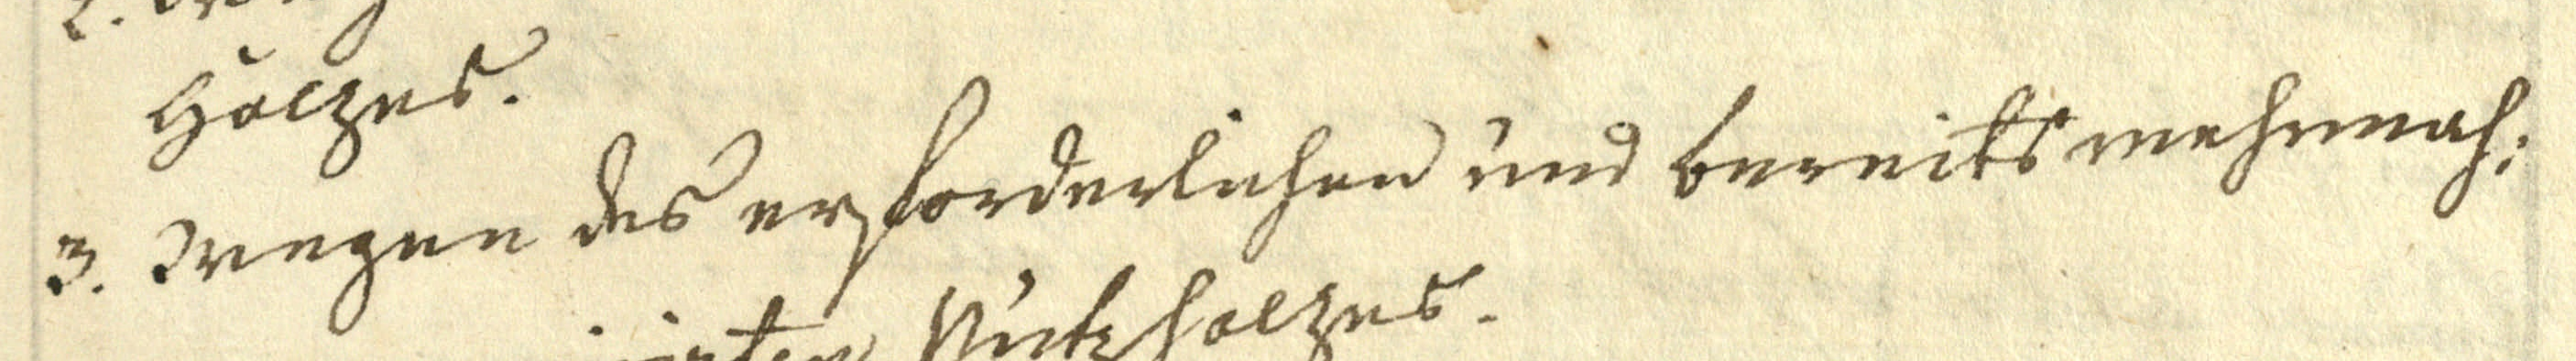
3. wegen des erforderlichen und bereits mehrmah¬
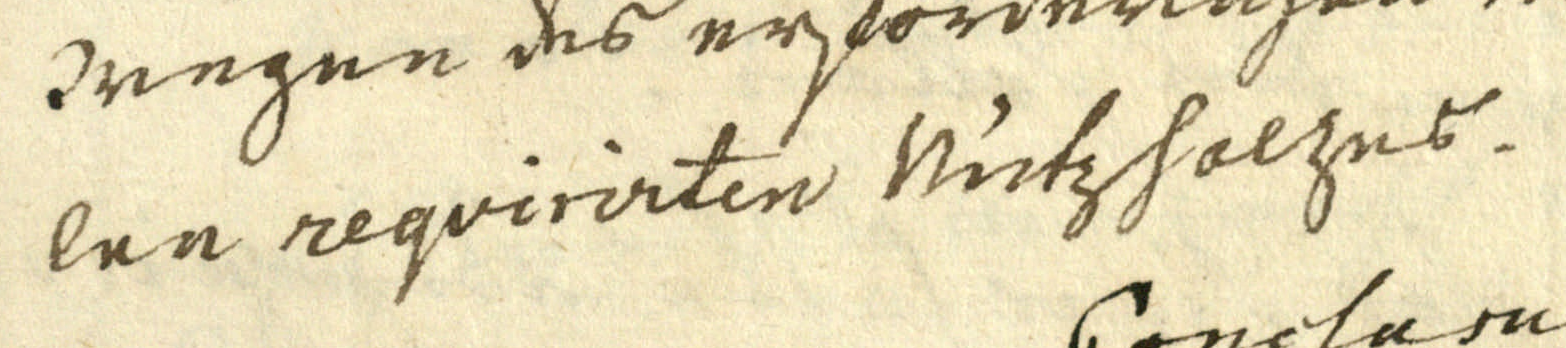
len requirirten Nutzholzes.
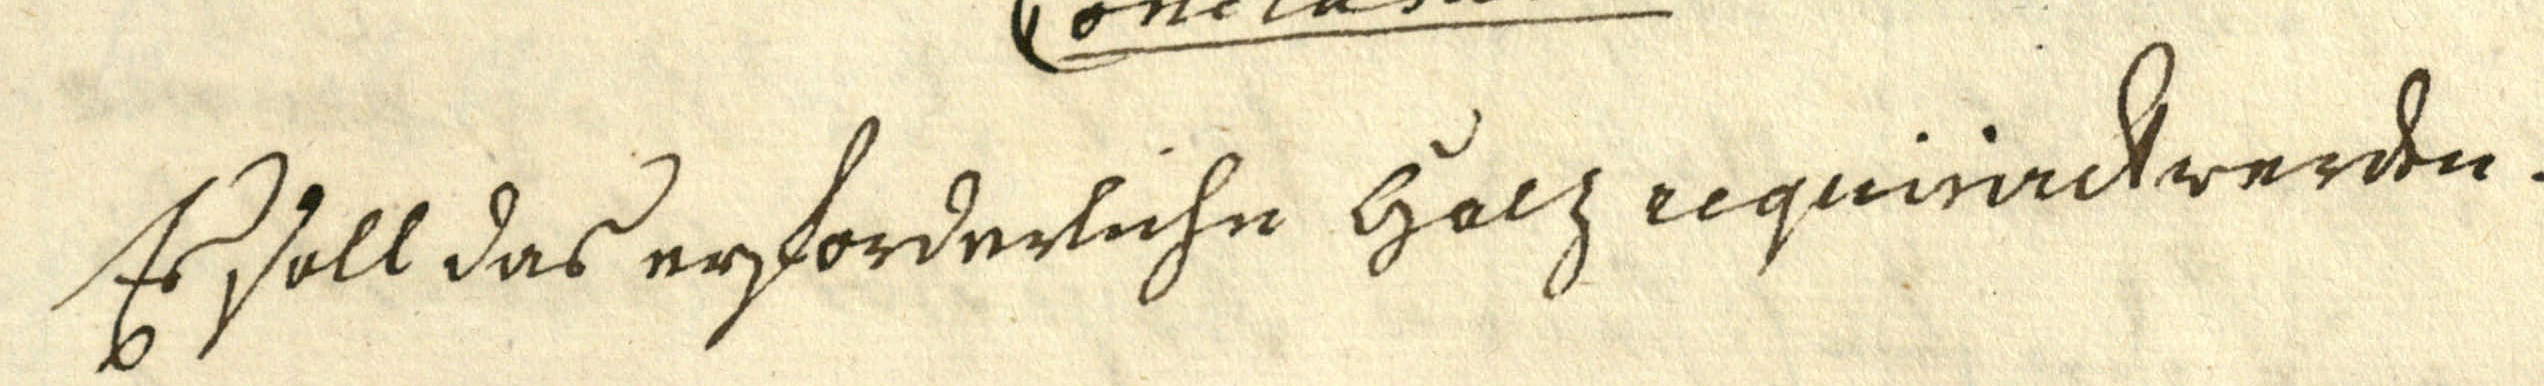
Es soll das erforderliche Holz requiriret werden.
